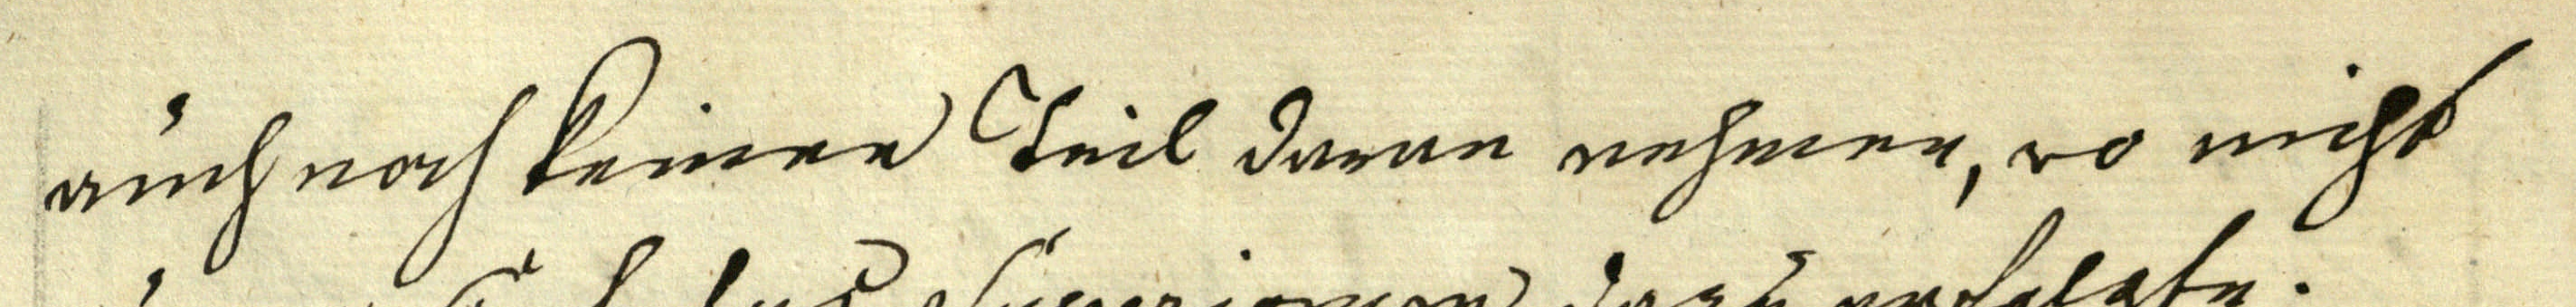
auch noch keinen Teil daran nehmen, wo nicht
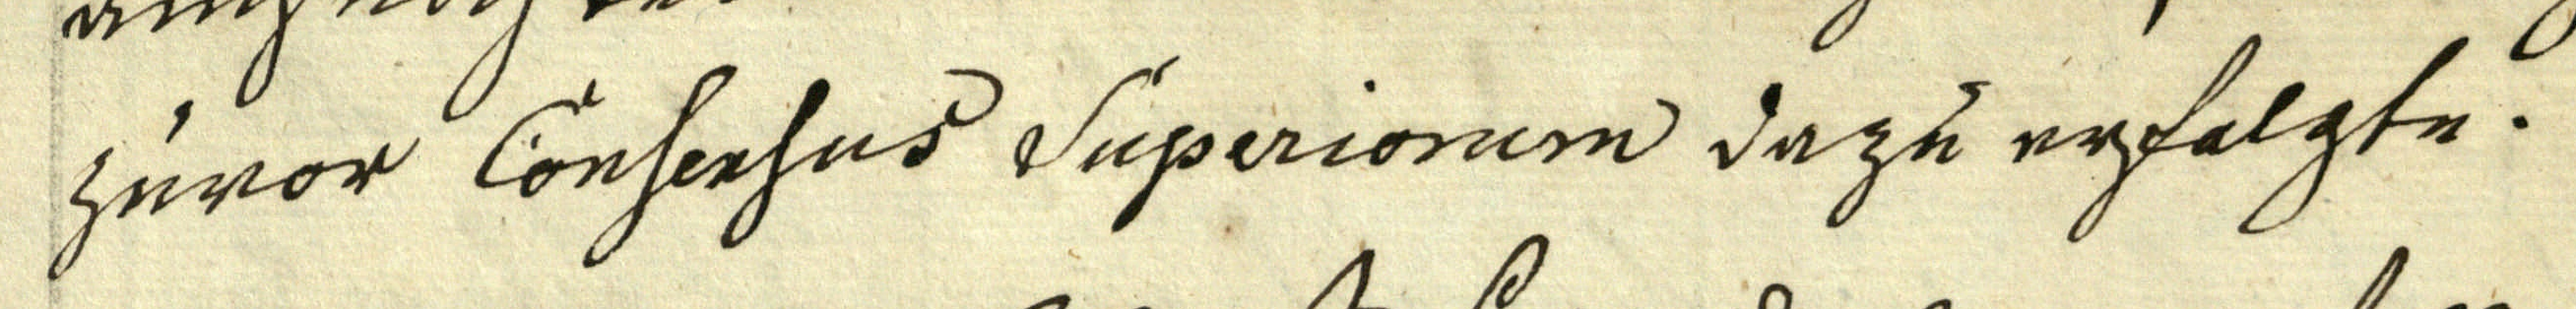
zuvor Consensus Superiorum dazu erfolgte.
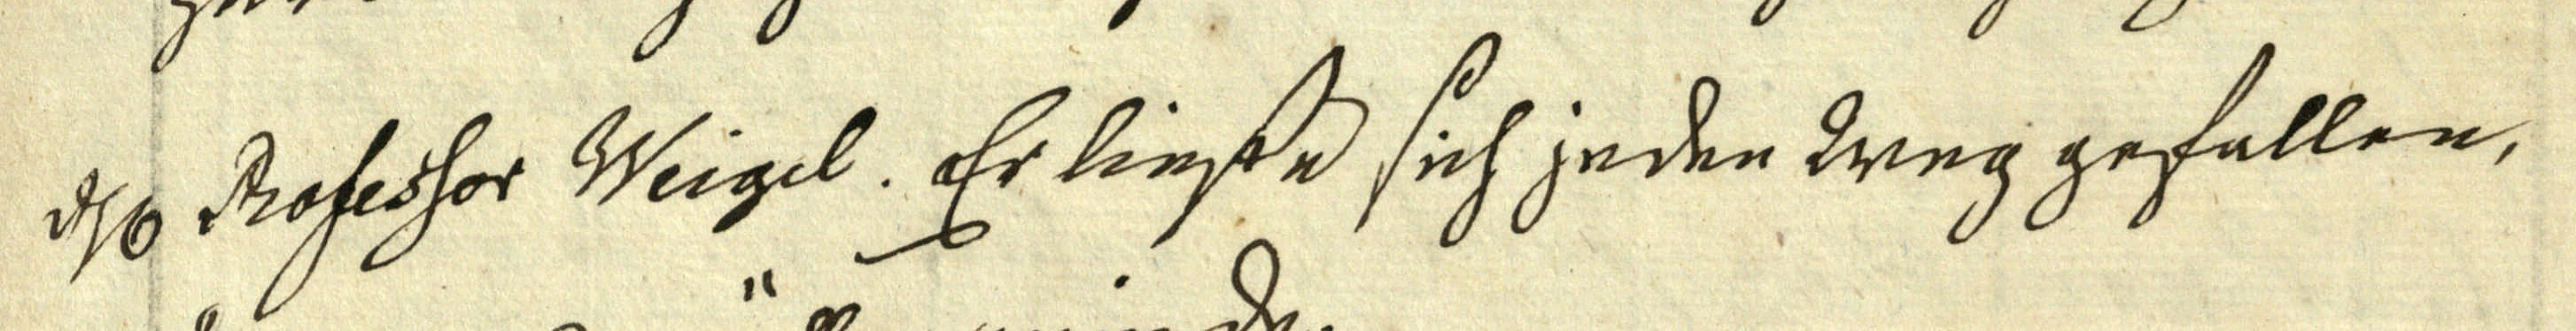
dh Professor Weigel. Er ließe sich jeden Weg gefallen,
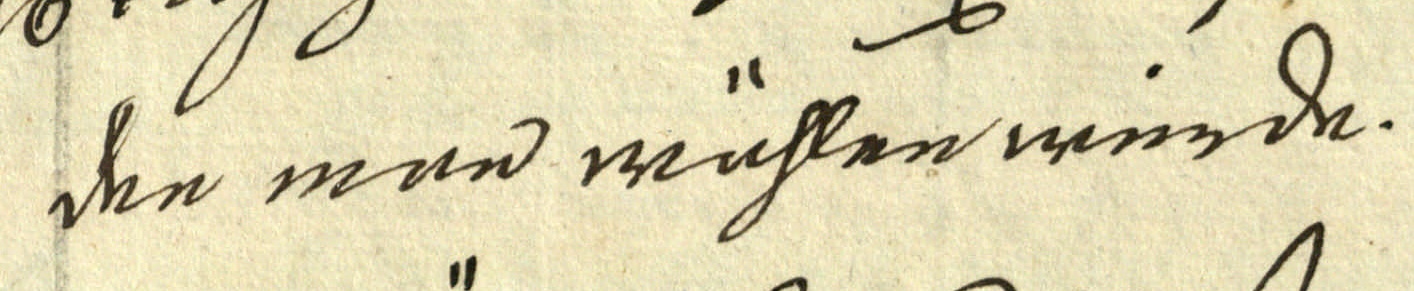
den man wählen würde.
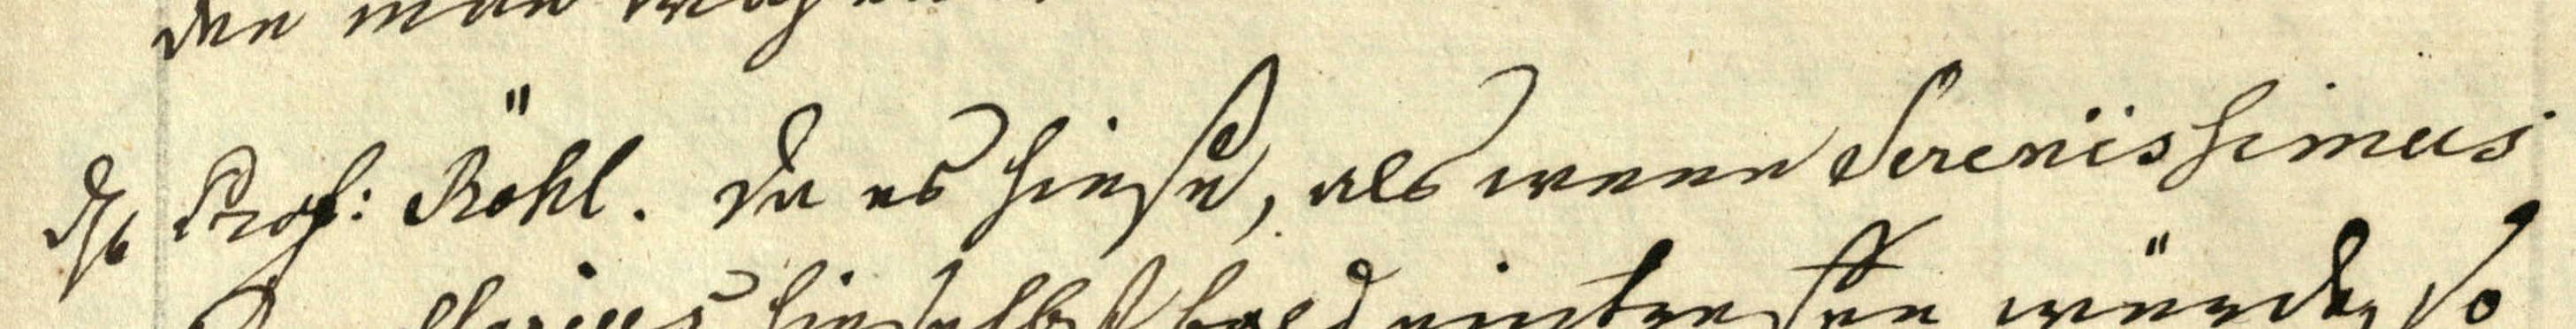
dh Prof. Röhl. Da es hieße, als wenn Serenissimus
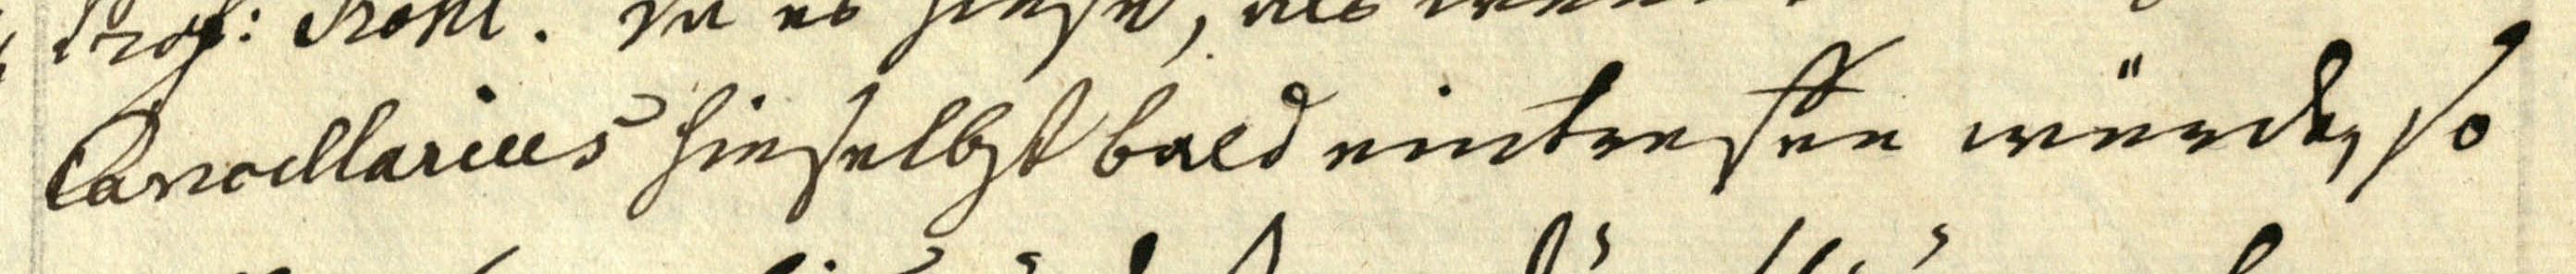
Cancellarius hieselbst bald eintreffen würde, so
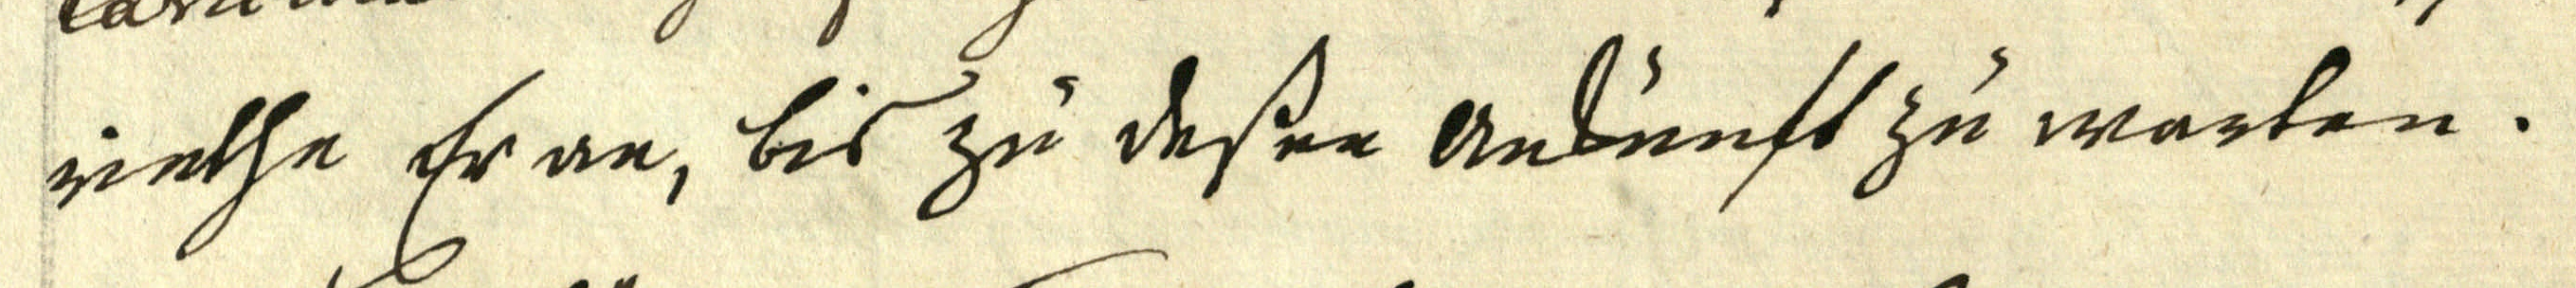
riethe Er an, bis zu deßen Ankunft zu warten.
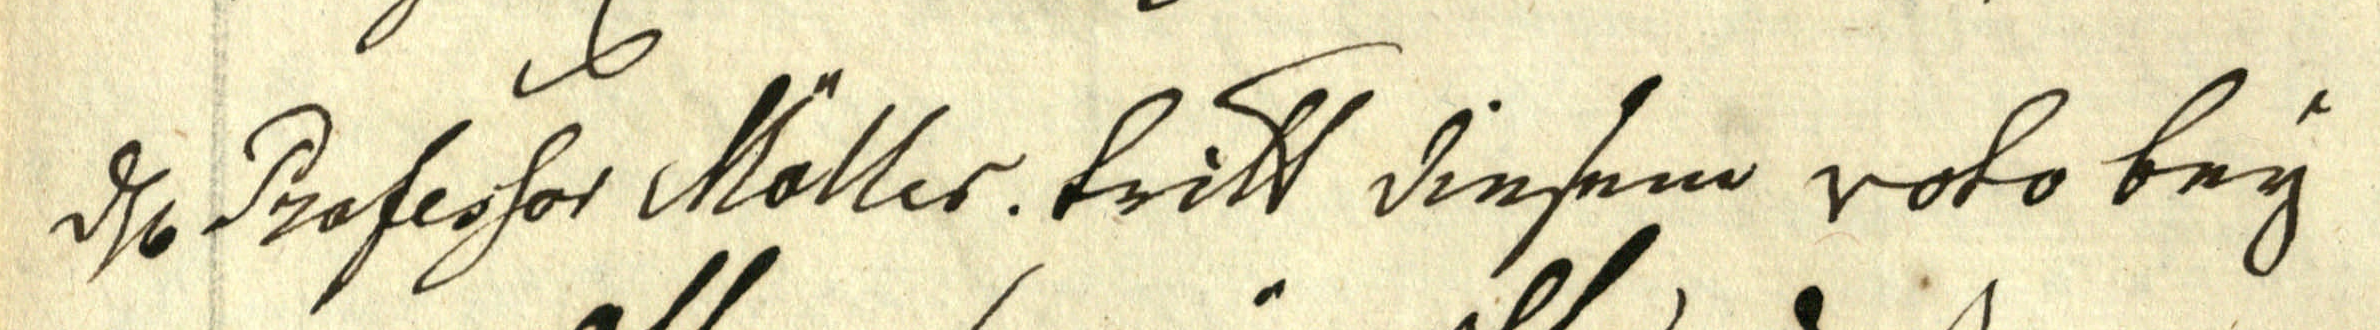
dh Professor Möller trii diesem voto beÿ.
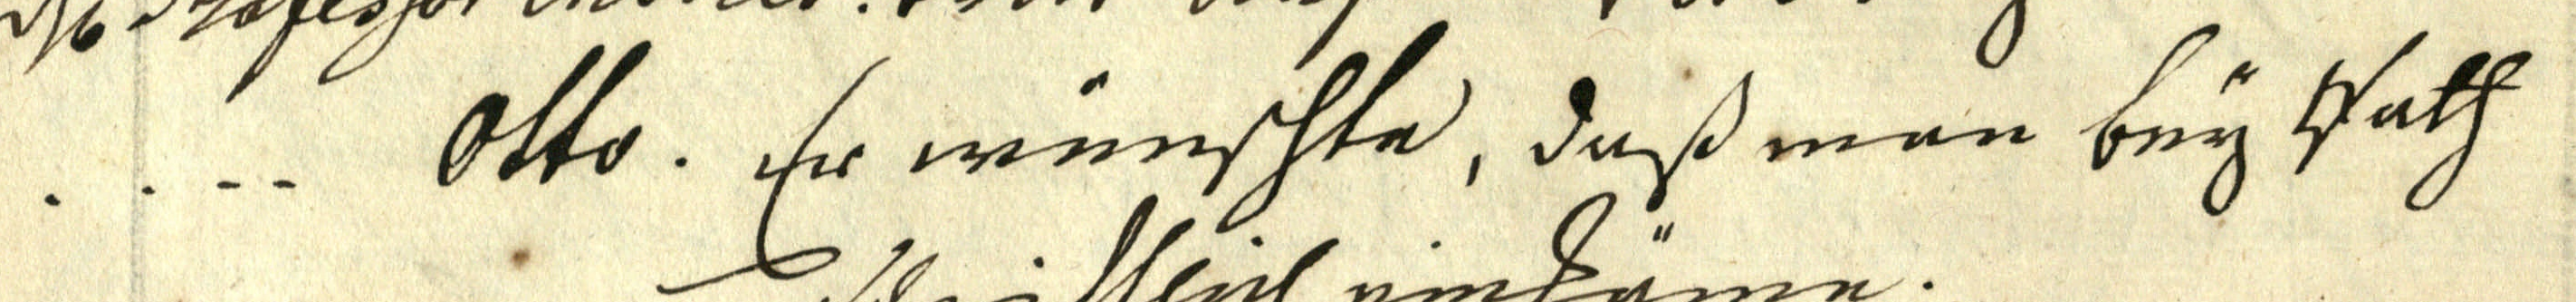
Otto. Er wünschte, daß man beÿ Rath
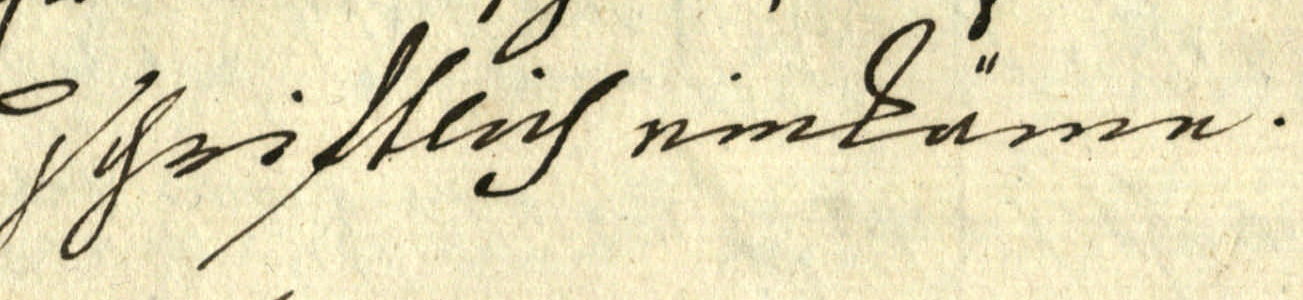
schriftlich einkäme.
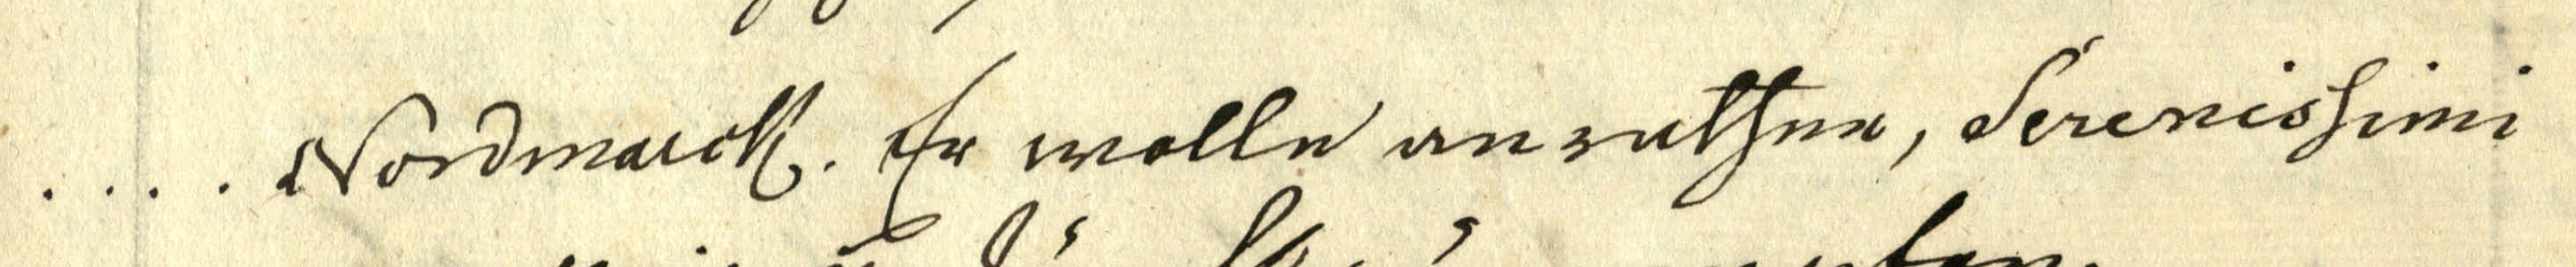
Nordmarck. Er wolle anrathen, Serenissimi
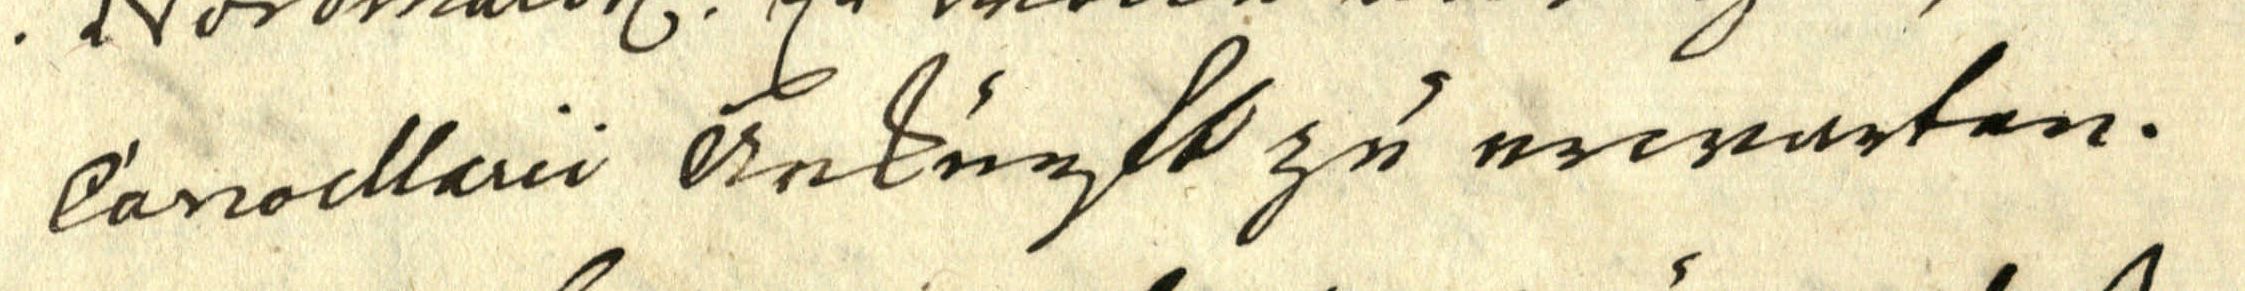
Cancellarii Ankunft zu erwarten.
